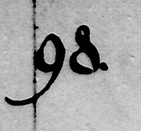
40.
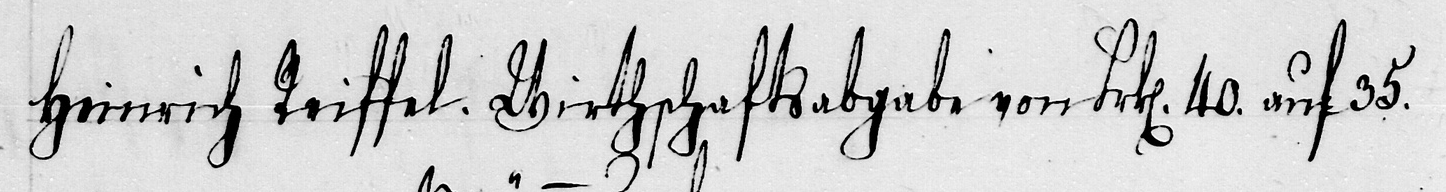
Heinrich Reiffel. Wirthschaftsabgabe von Frk[en]. 40.
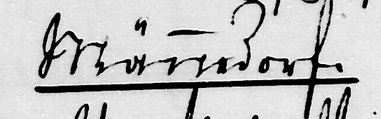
Männedorf.
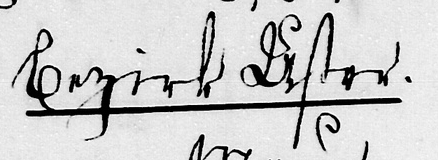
Bezirk Uster.
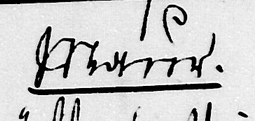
Maur.
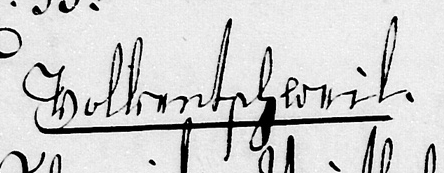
Volkentschweil.
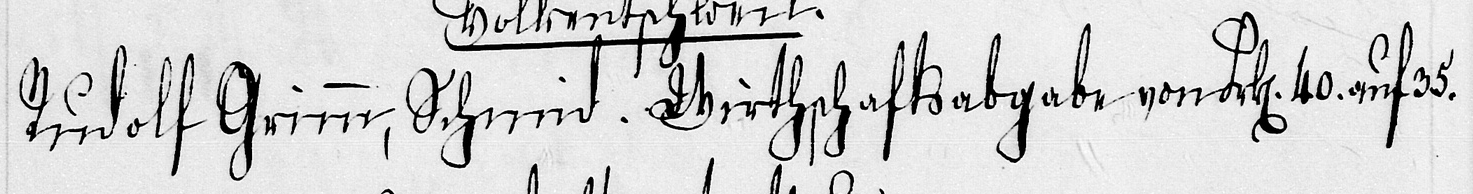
Rudolf Grimm, Schmid. Wirthschaftsabgabe von Frk[en]. 40.
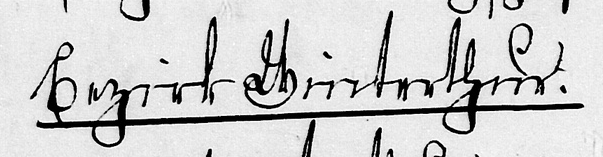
Bezirk Winterthur.
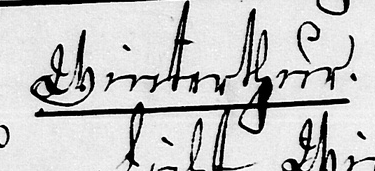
Winterthur.
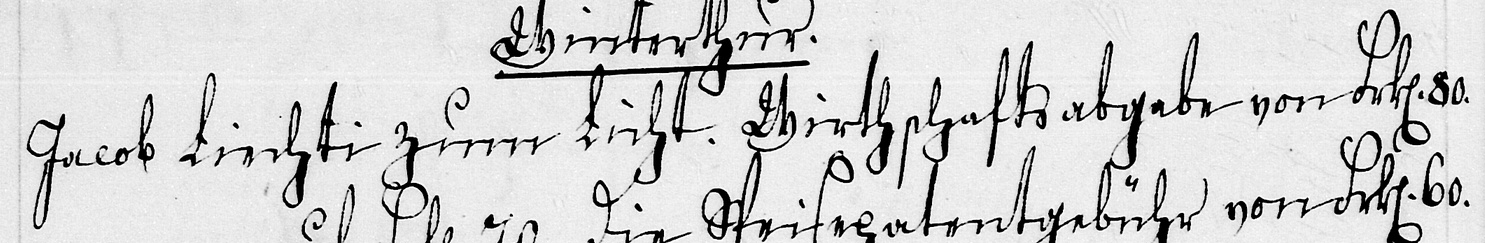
Jacob Liechti zum Licht. Wirthschaftsabgabe von Frk[en].
